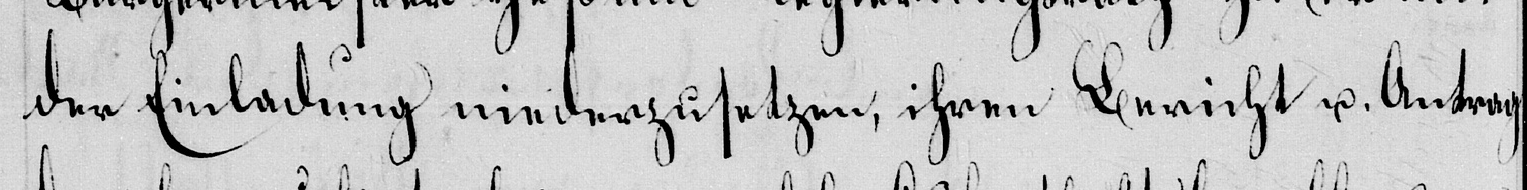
der Einladung niederzusetzen, Ihren Bericht u. Antrag
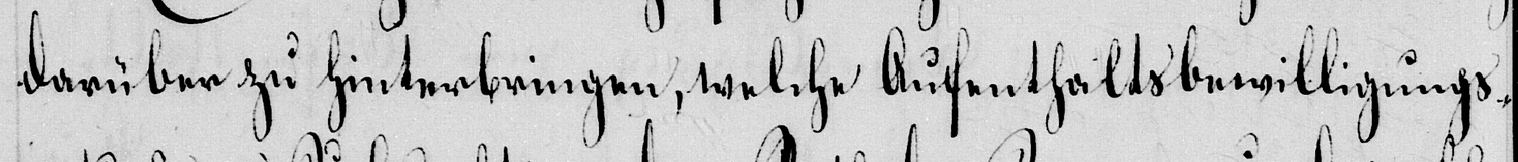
darüber zu hinterbringen, welche Aufenthaltsbewilligungs¬
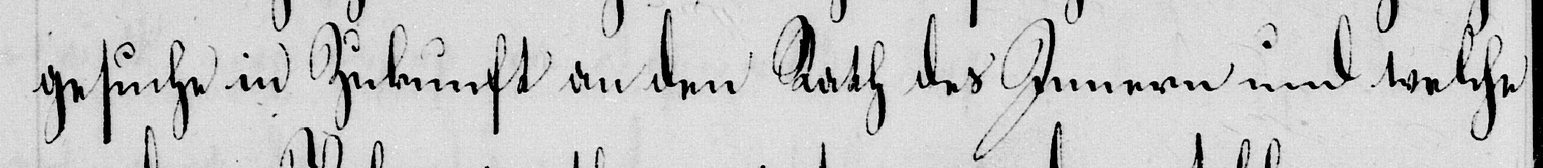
gesuche in Zukunft an den Rath des Innern und welche
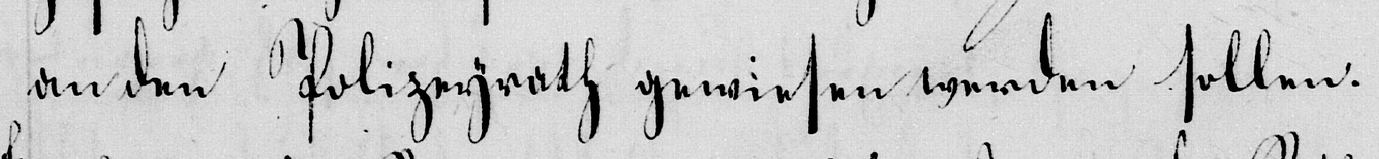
an den Polizeyrath gewiesen werden sollen.
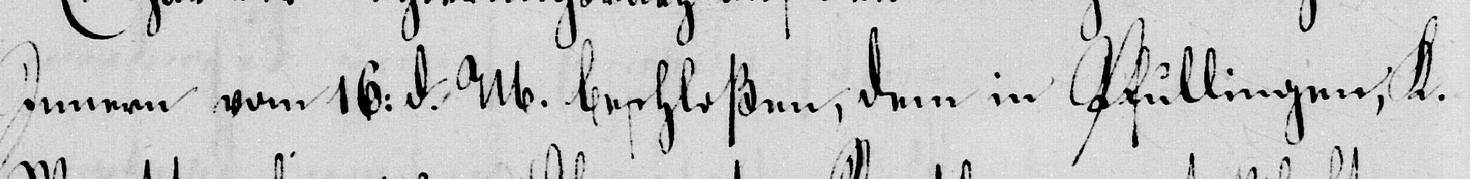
Innern vom 16. d. M. beschloßen, dem in Pfullingen, K.
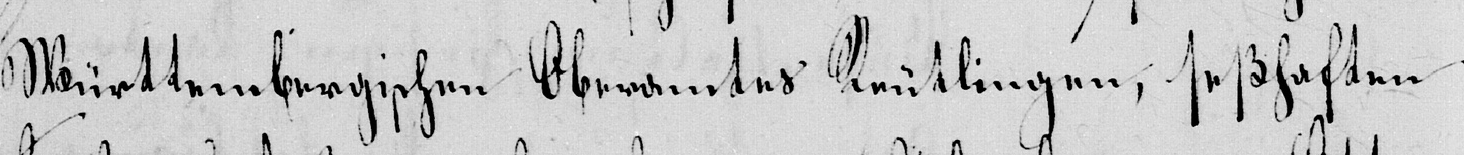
Württembergischen Oberamtes Reutlingen, seßhaften
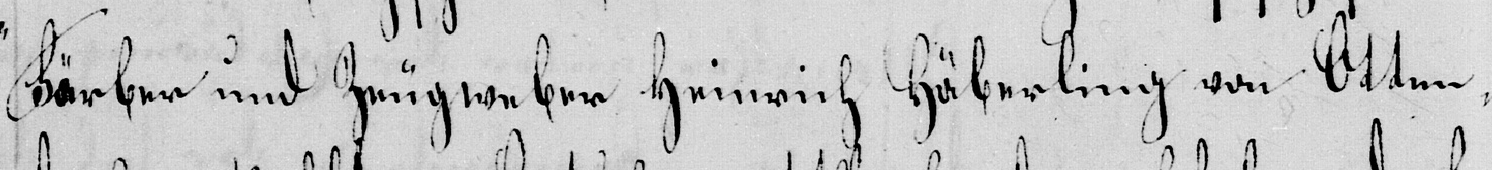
Färber und Zeugweber Heinrich Häberling von Otten¬
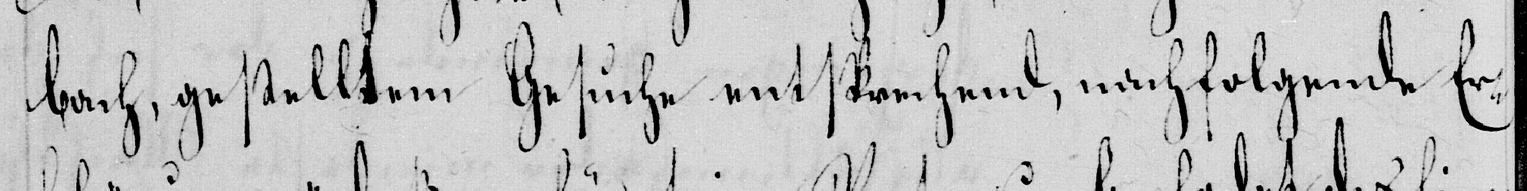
bach, gestelltem Gesuche entsprechend, nachfolgende Er¬
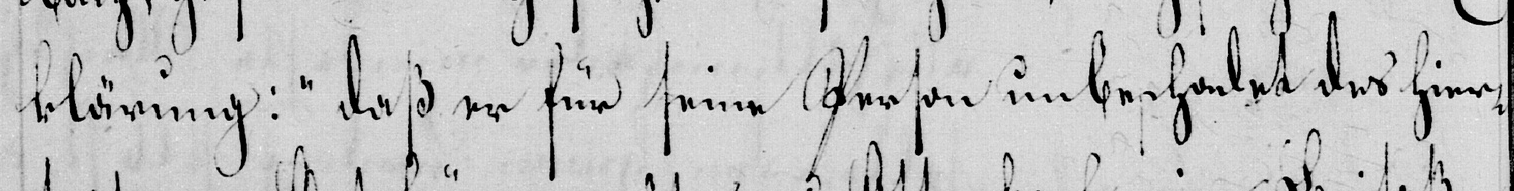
klärung: „daß er für seine Person unbeschadet des hier¬
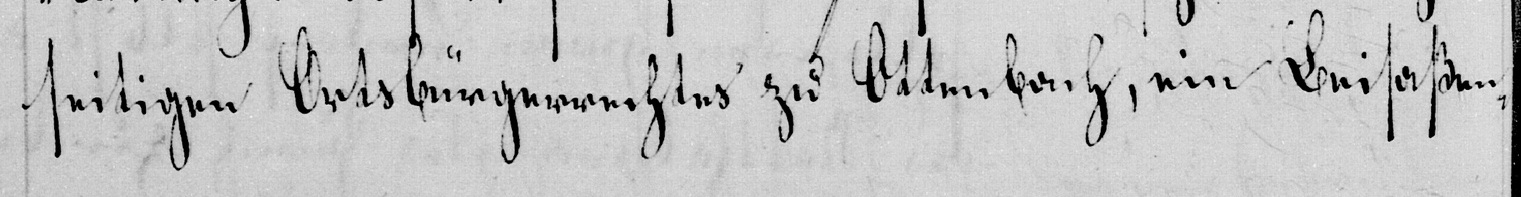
seitigen Ortsbürgerrechtes zu Ottenbach, ein Beisaßen-
